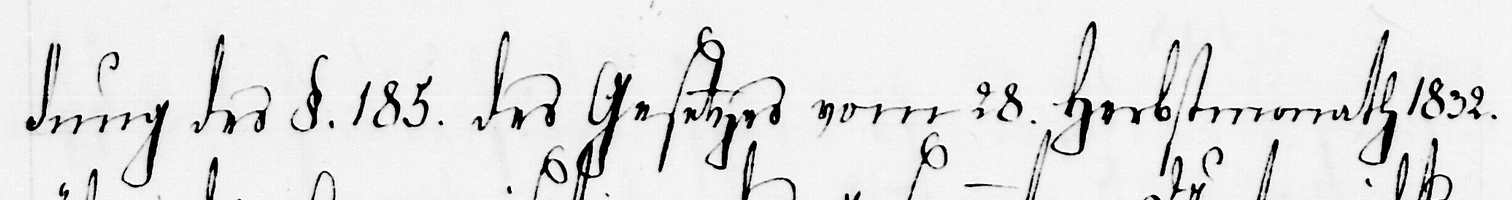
dung des §. 185. des Gesetzes vom 28. Herbstmonath 1832.
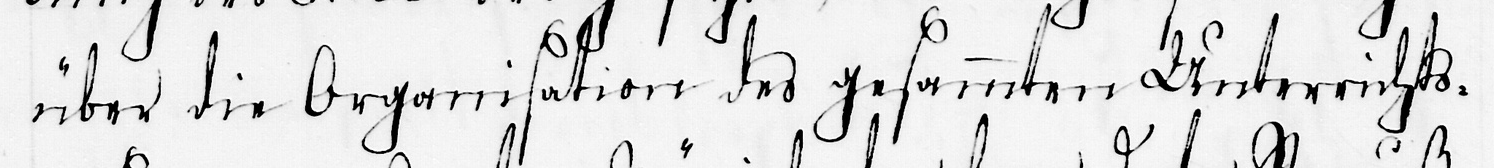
über die Organisation des gesammten Unterrichts¬
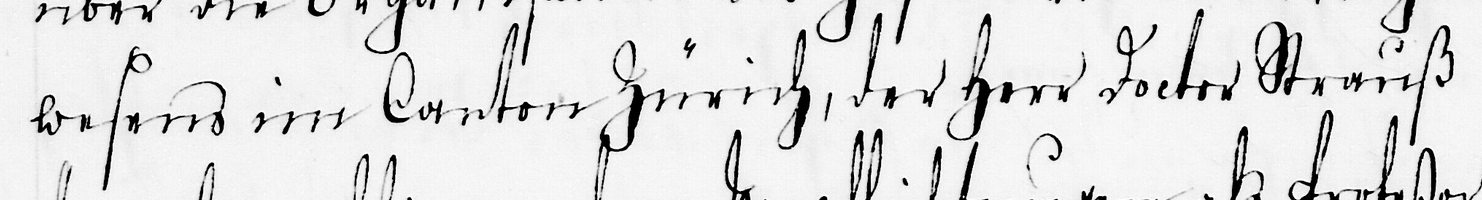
wesens im Canton Zürich, der Herr Doctor Strauß
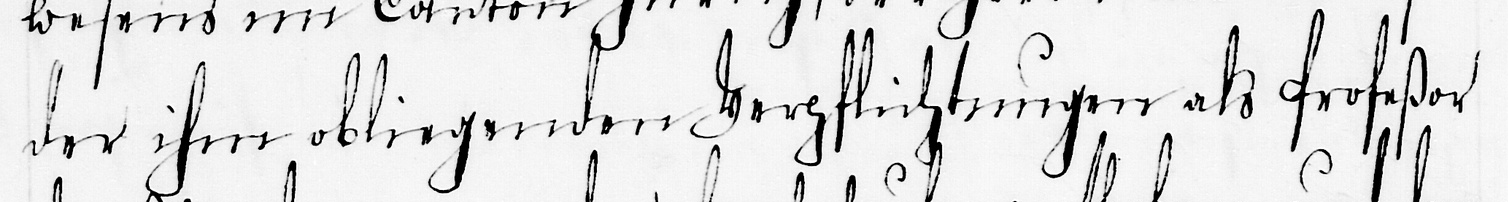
der ihm obliegenden Verpflichtungen als Profeßor
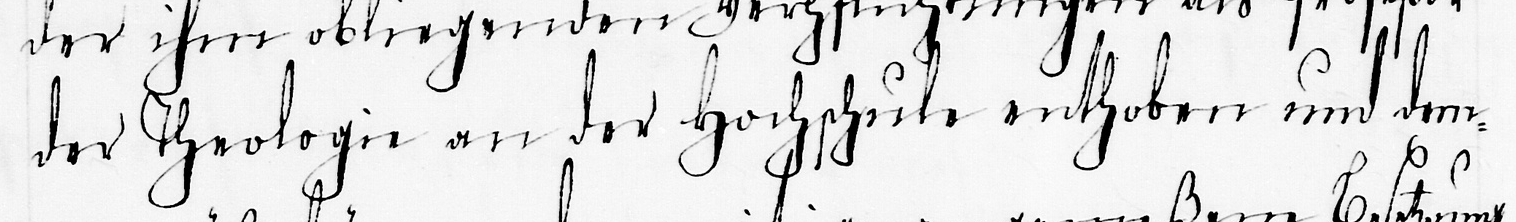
der Theologie an der Hochschule enthoben und dem¬
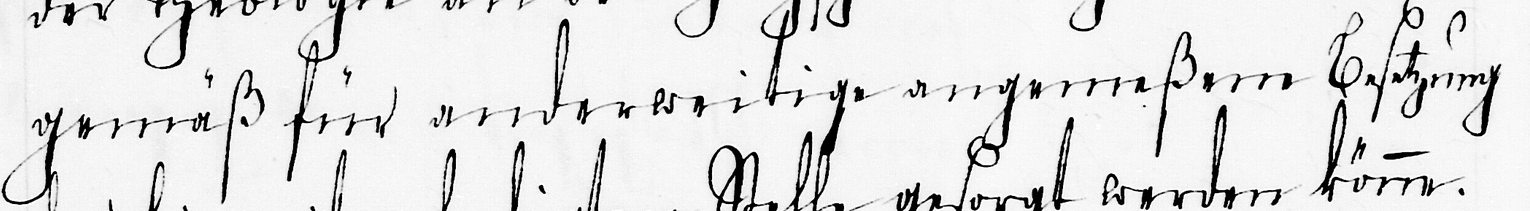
gemäß für anderweitige angemeßene Besetzung
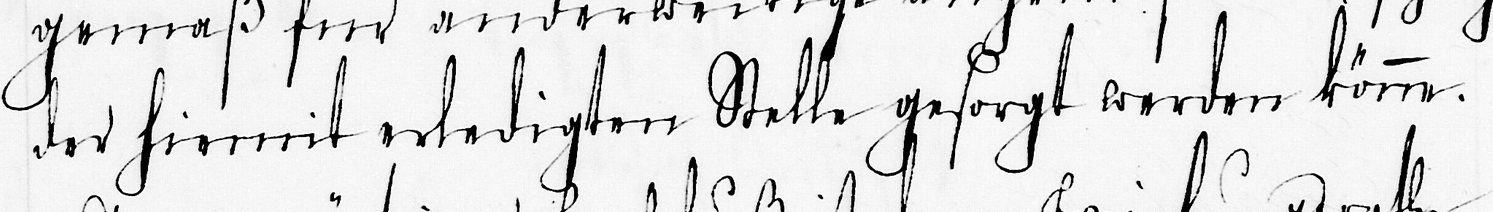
der hiemit erledigten Stelle gesorgt werden könne.
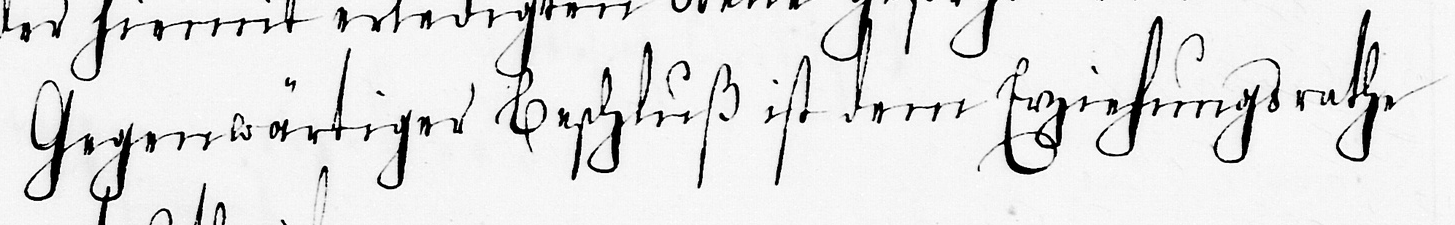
Gegenwärtiger Beschluß ist dem Erziehungsrathe
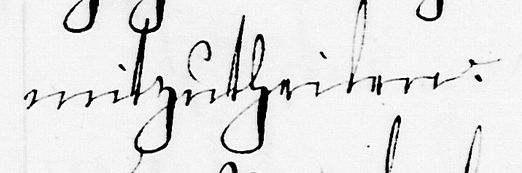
mitzutheilen:
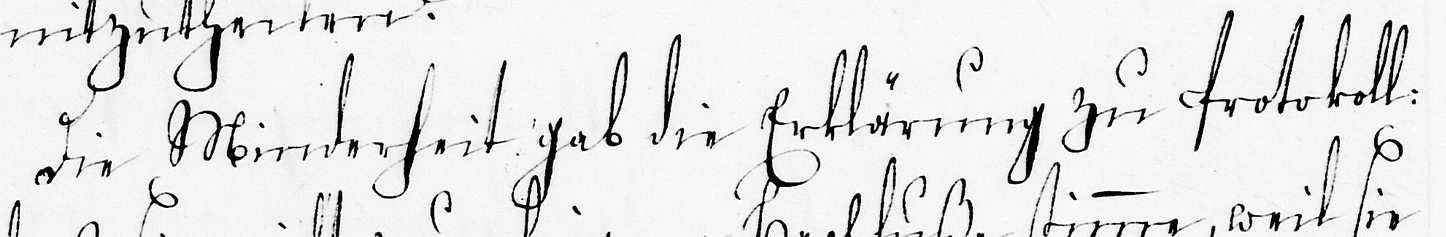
Die Minderheit gab die Erklärung zu Protokoll:
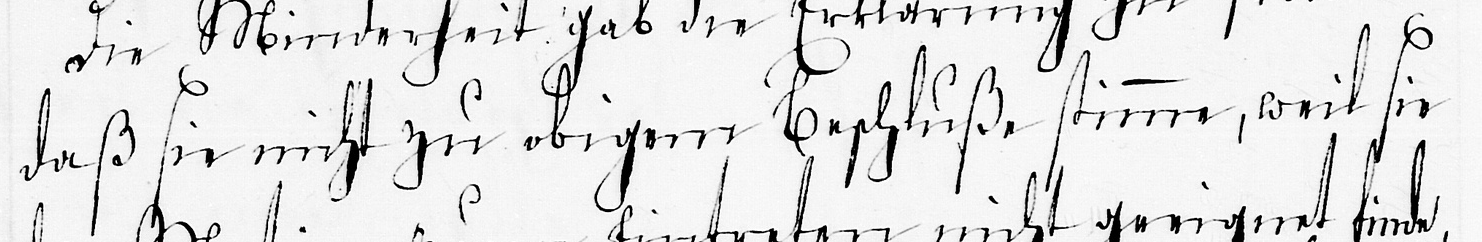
daß sie nicht zu obigem Beschluße stimme, weil sie
